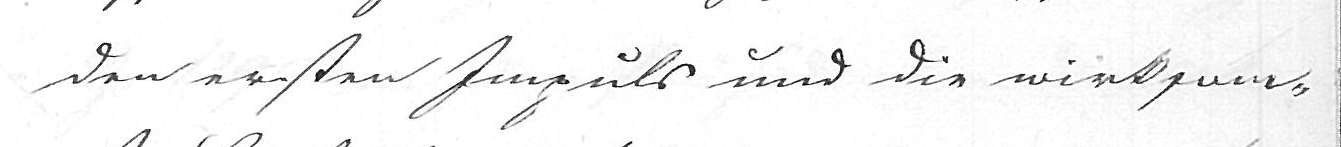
den ersten Impuls und die wirksam-
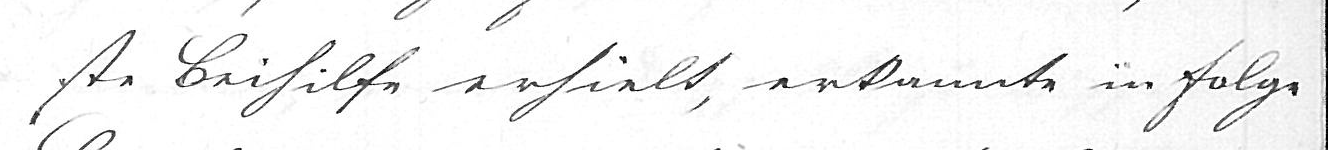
ste Beihilfe erhielt, erkannt in Folge
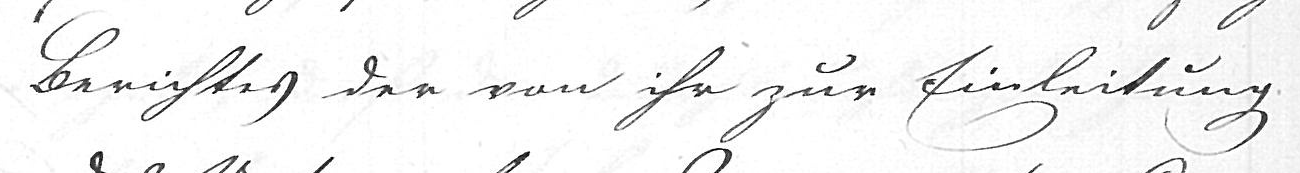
Berichtes der von ihr zur Einleitung
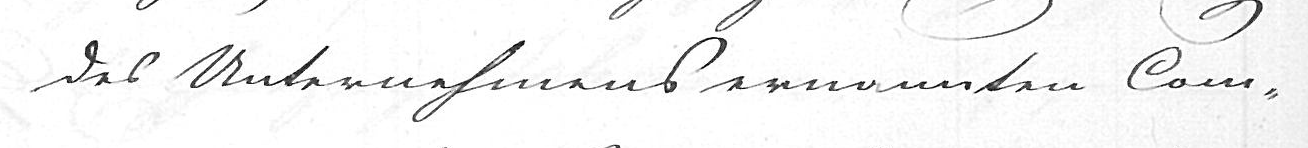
des Unternehmens ernannten Com-
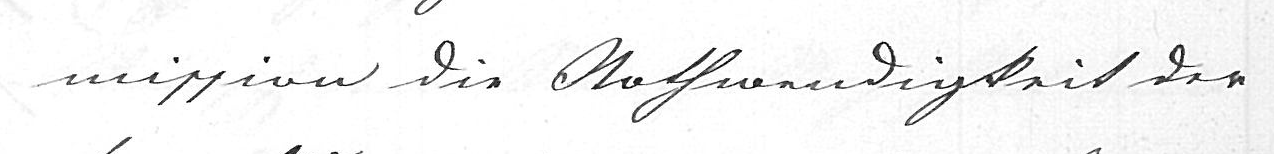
mission die Nothwendigkeit der
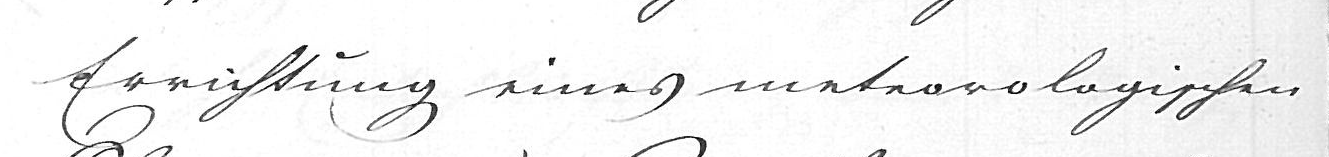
Errichtung eines meteorologischen
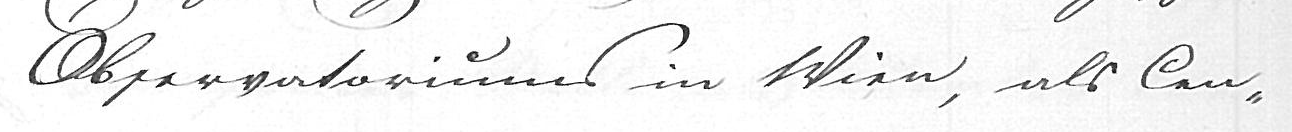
Observatoriums in Wien, als Cen-
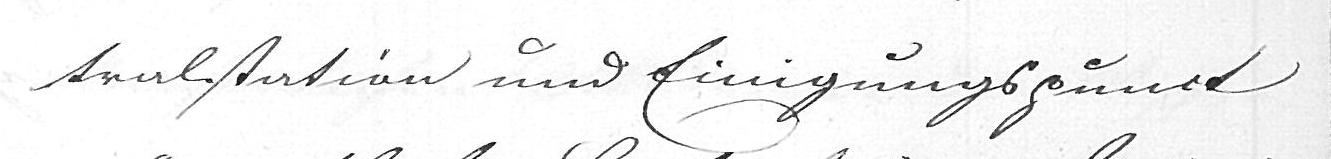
tralstation und Einigungspunct
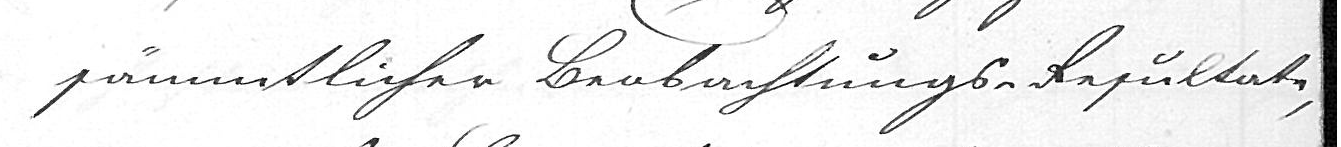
sämmtlicher Beobachtungs-Resultate,
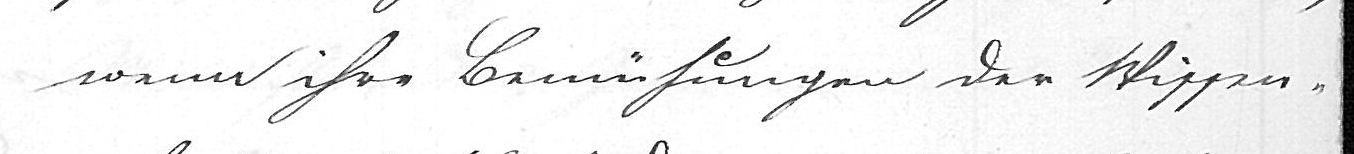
wenn ihre Bemühungen der Wissen-
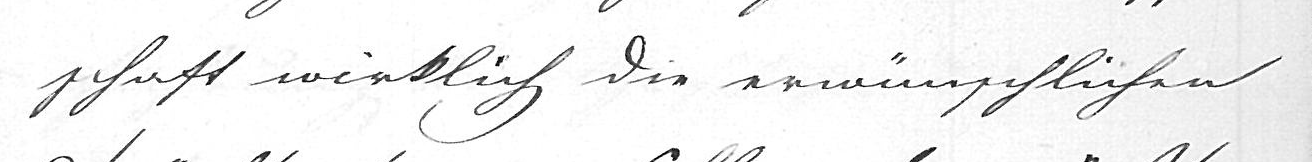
schaft wirklich die erwünschlichen
